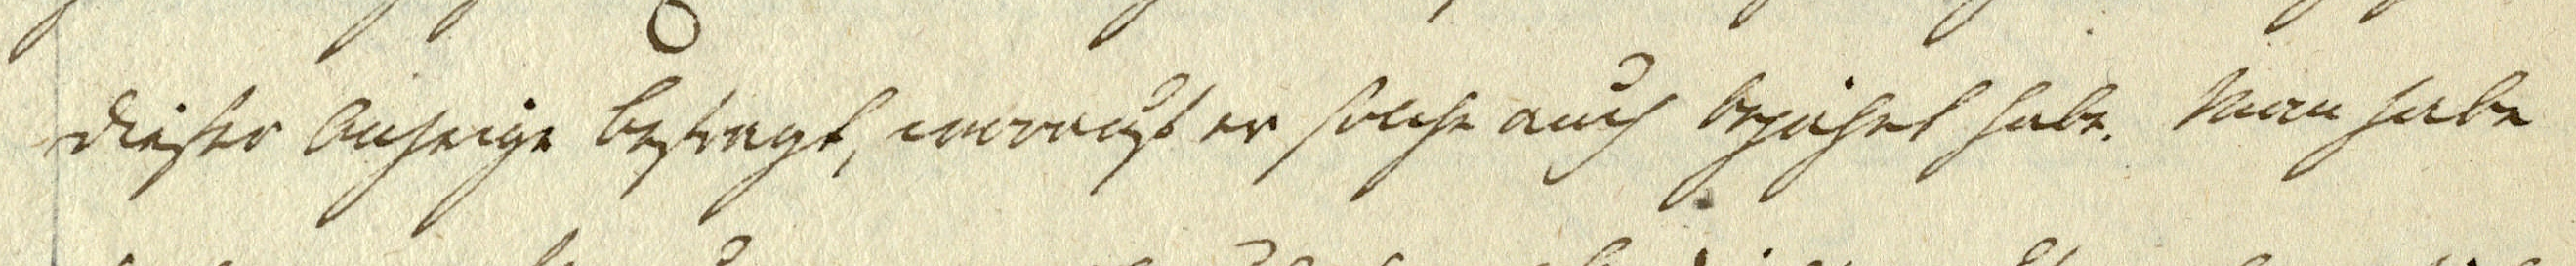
dieser Anzeige befragt, worauf er solche auch bejahet habe. Man habe
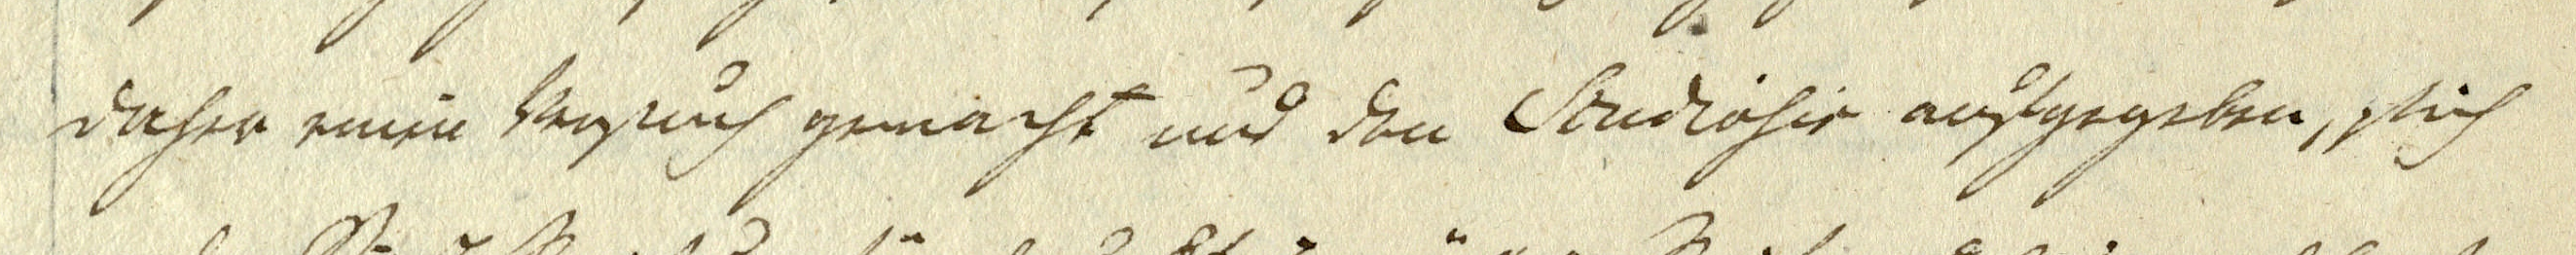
daher einen Versuch gemacht und den Studiosis aufgegeben, sich
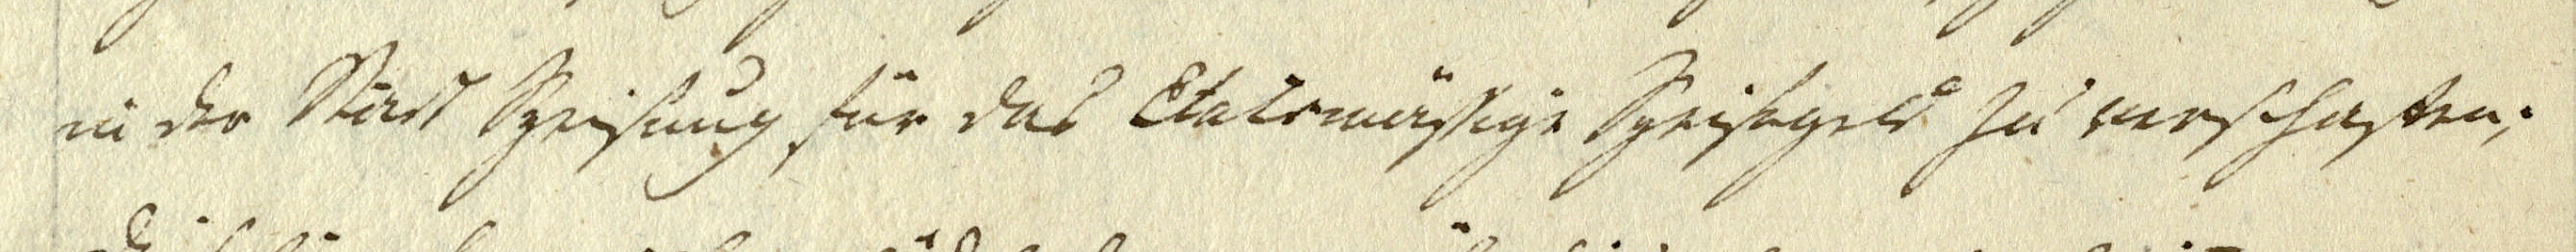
in der Stadt Speisung für das Etatsmäßige Speisegeld zu verschaffen;
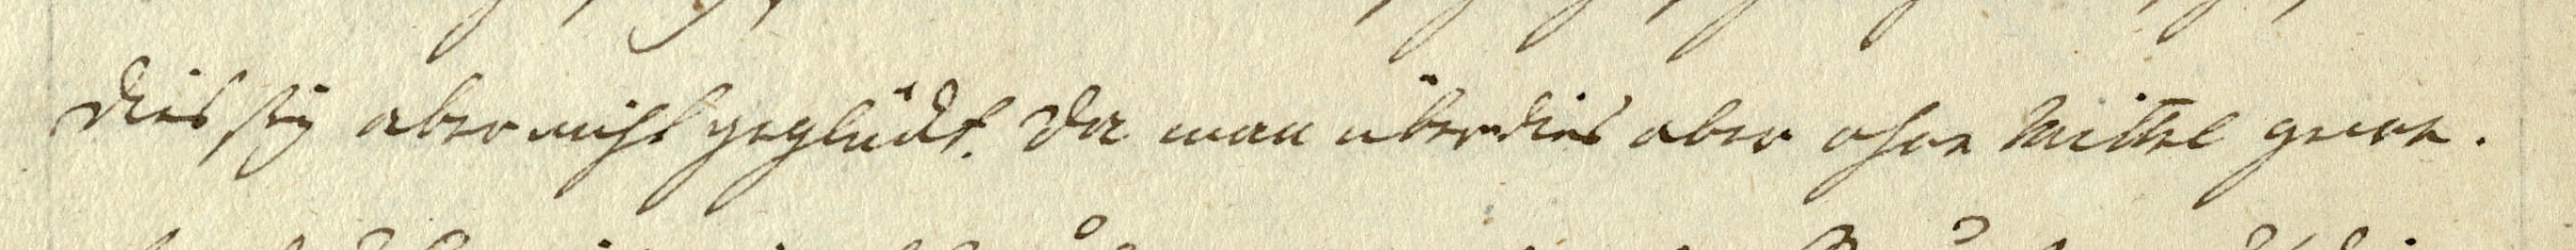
dies seÿ aber nicht geglückt. Da man überdies aber ohne Mittel gewe¬
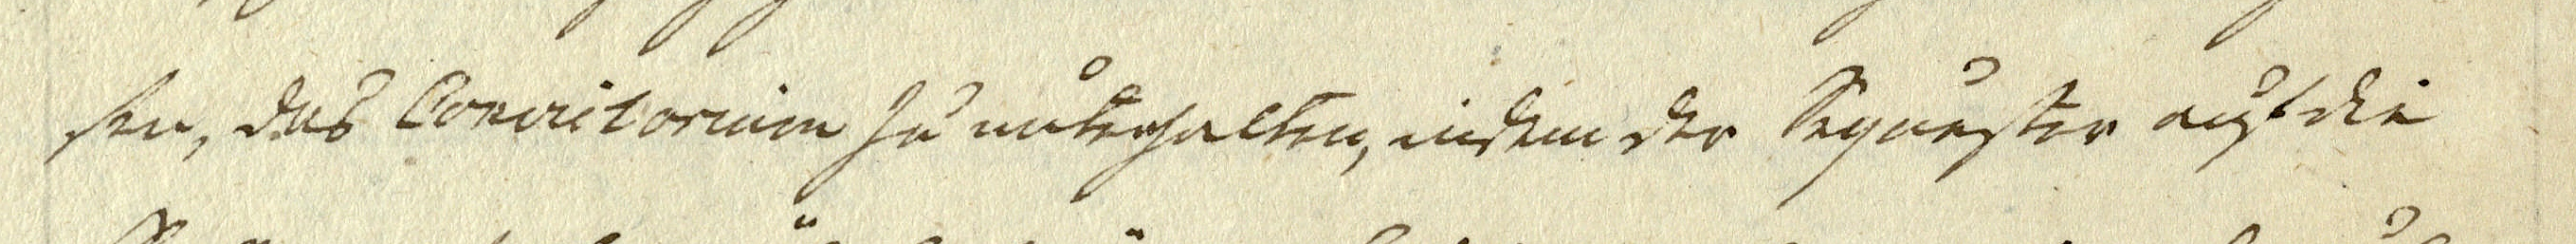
sen, das Convictorium zu unterhalten, indem der Sequester auf die
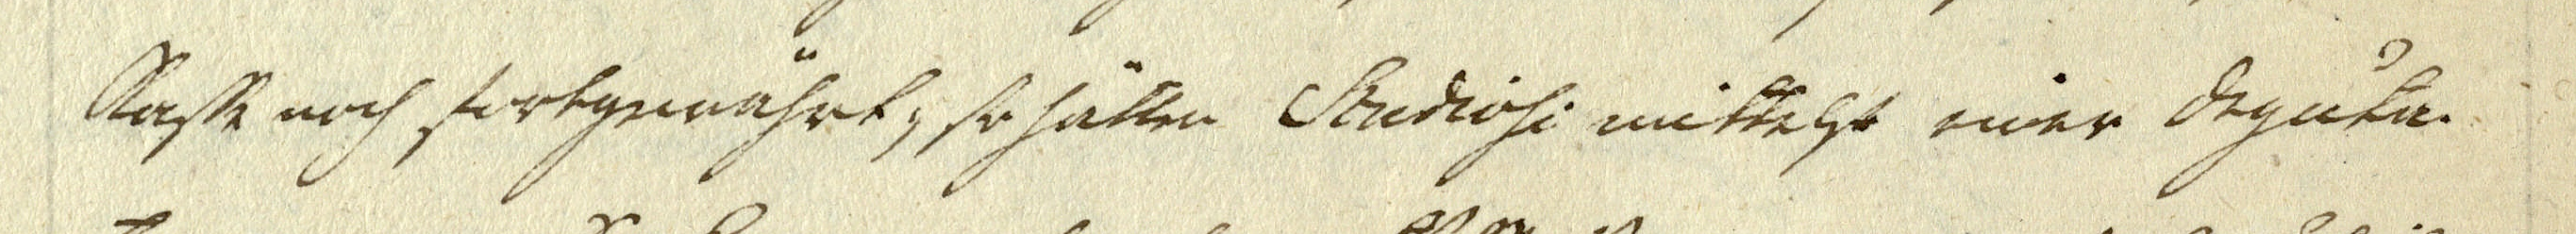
Casse noch fortgewährt; so hätten Studiosi mittelst einer Deputa¬
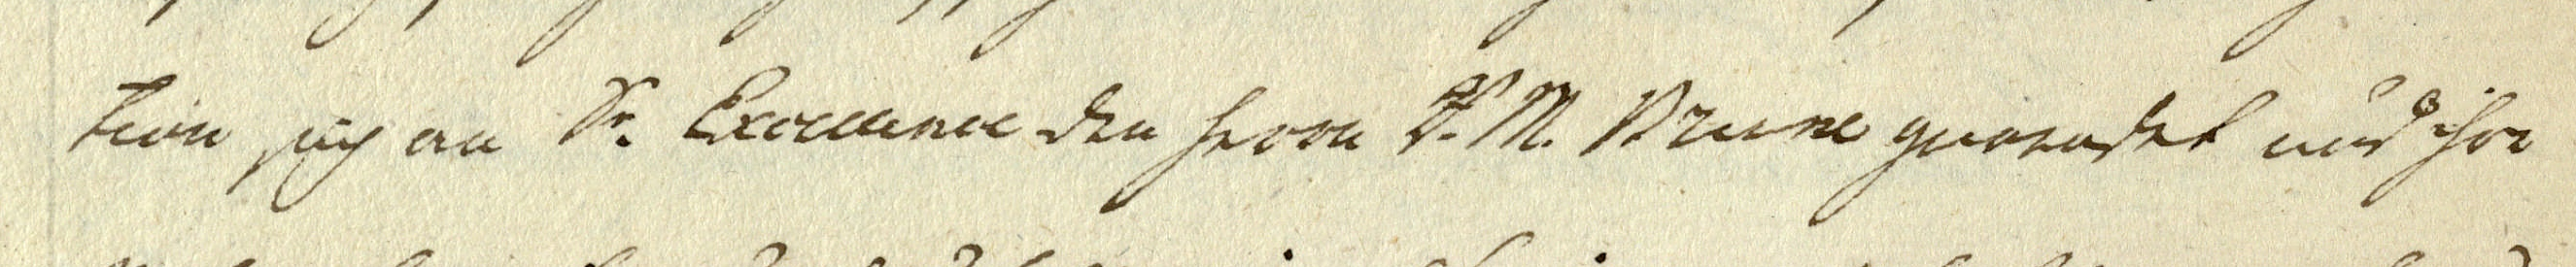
tion sich an Sr. Excellence den Herrn R. M. Brune gewendet und ihre
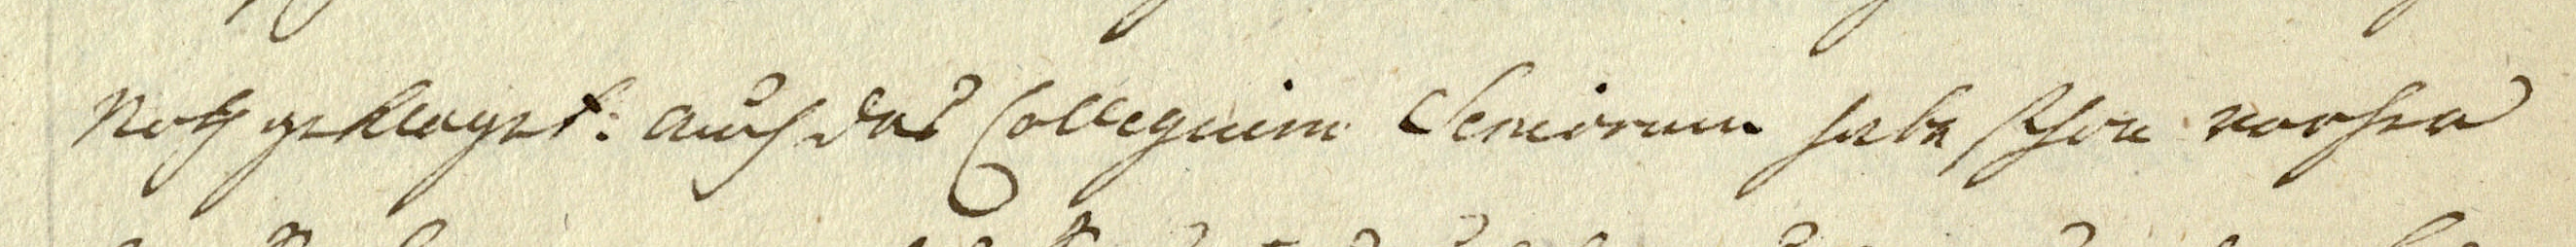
Noth geklaget: auch das Collegium Seniorum habe schon vorher
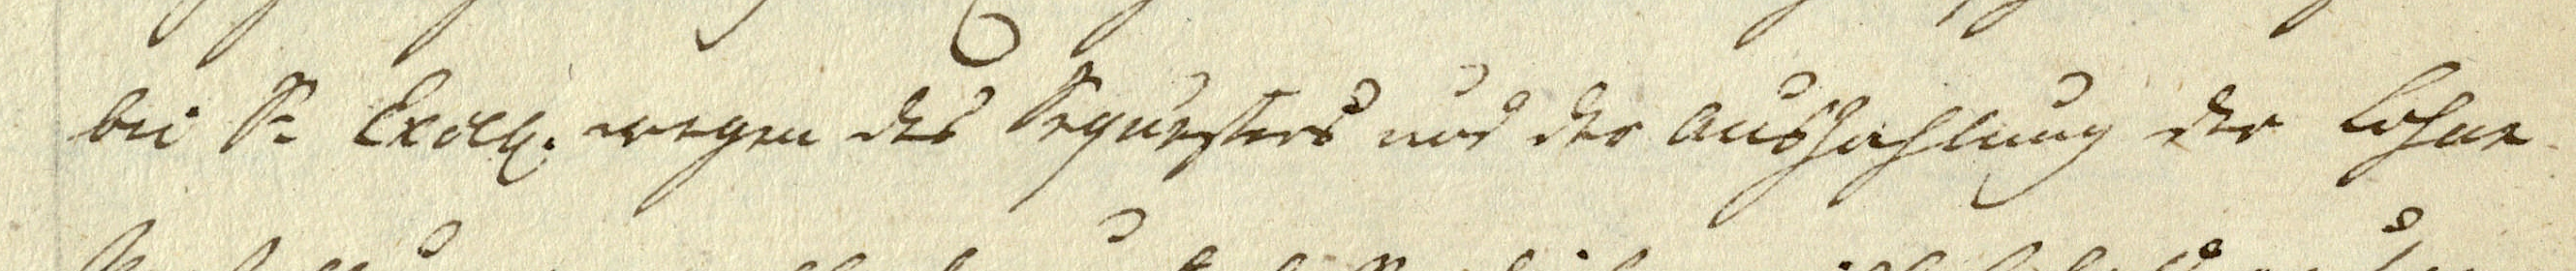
bei Sr Excel. wegen des Sequesters und der Auszahlung der Lohne
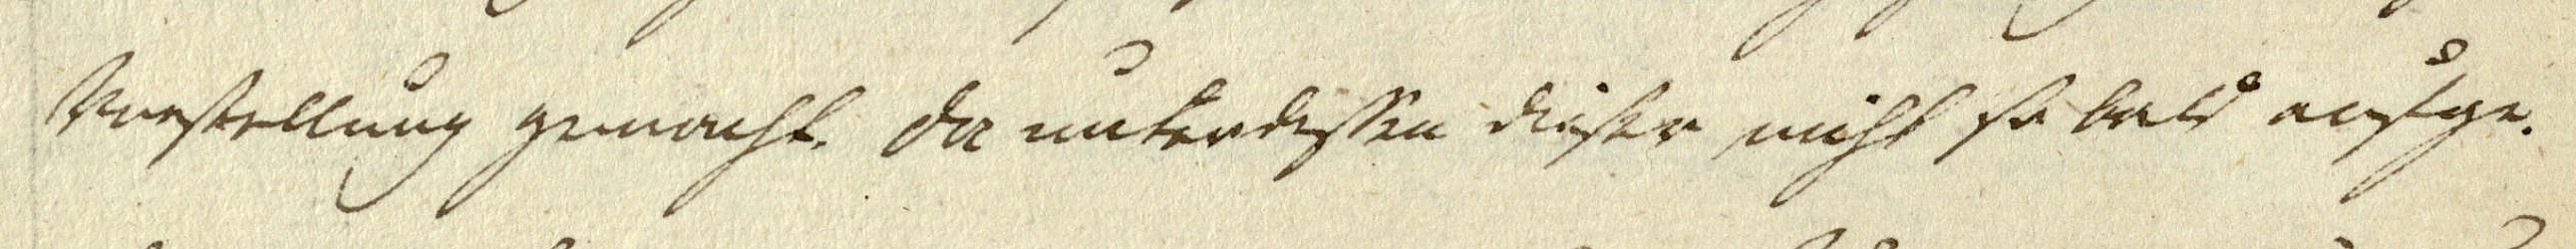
Vorstellung gemacht. Da unterdessen dieser nicht so bald aufge¬
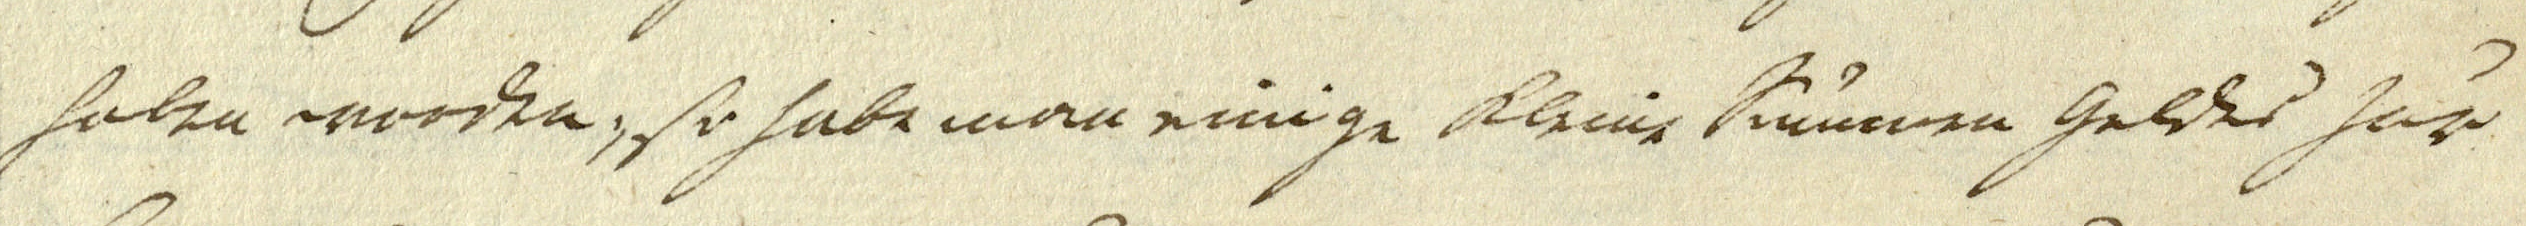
hoben worden, so habe man einige kleine Summen Geldes zur
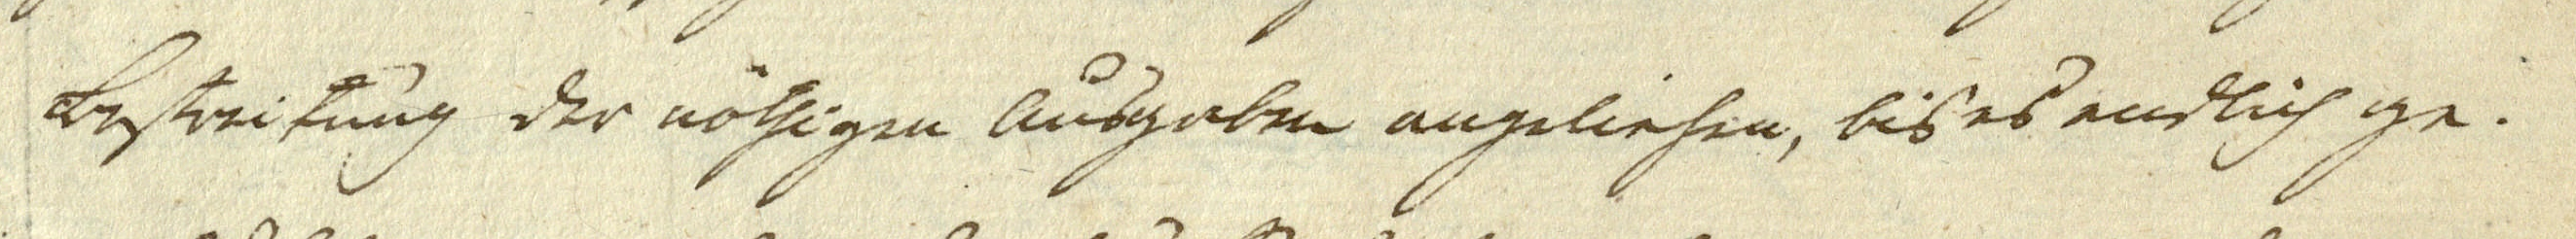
Bestreitung der nöthigen Ausgaben angeliehen, bis es endlich ge¬
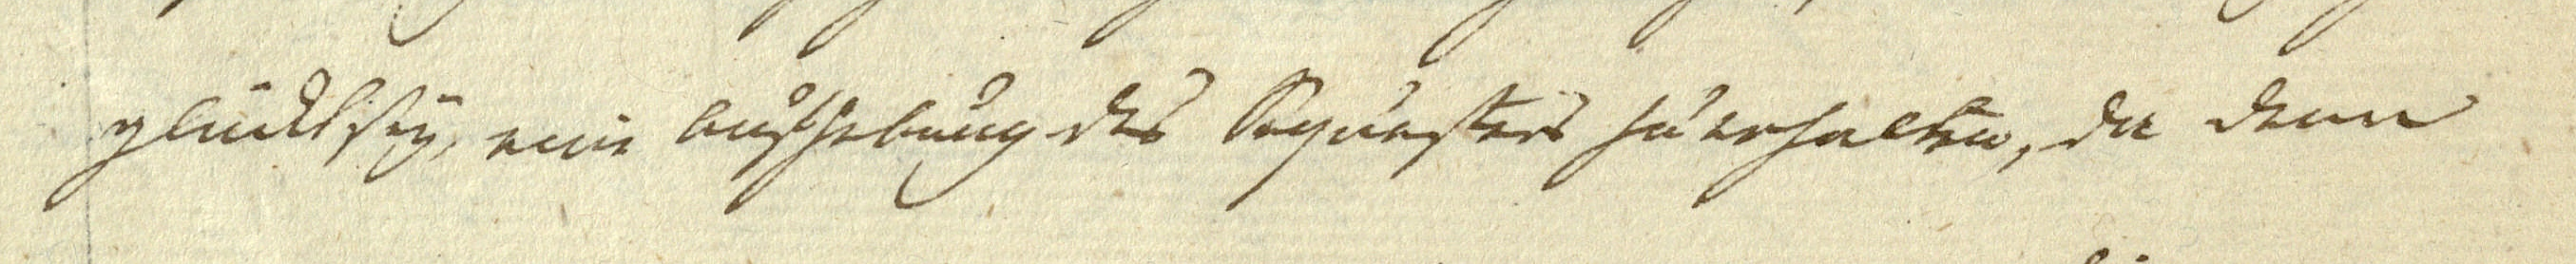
glückt seÿ, eine Aufhebung des Sequesters zuerhalten, da denn
